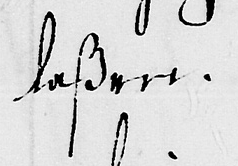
laßen.
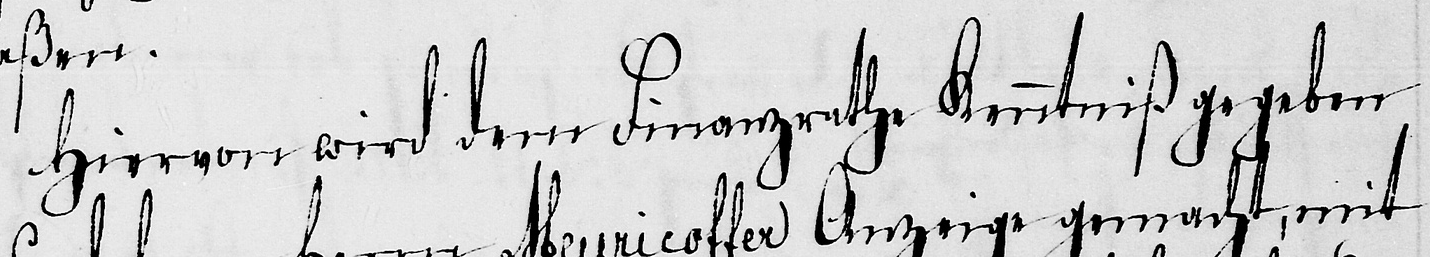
Hiervon wird dem Finanzrathe Kenntniß gegeben
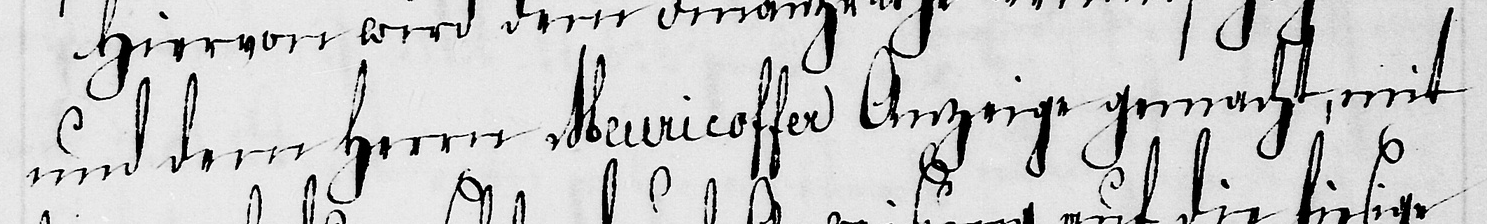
und dem Herrn Meuricoffer Anzeige gemacht, mit
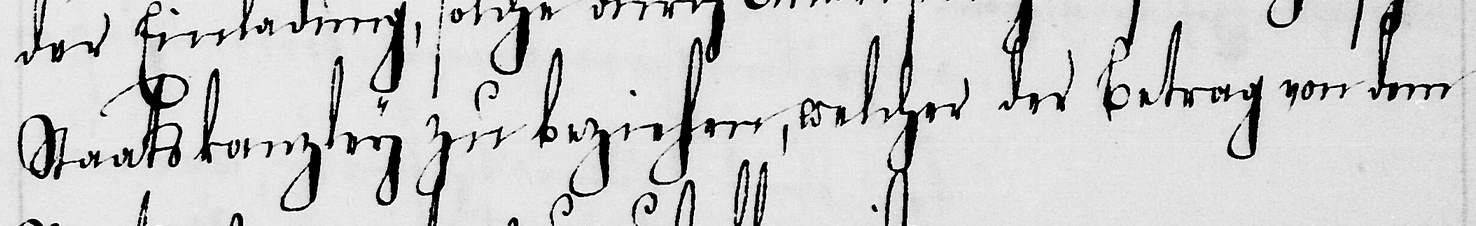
Staatskanzley zu beziehen, welcher der Betrag von dem
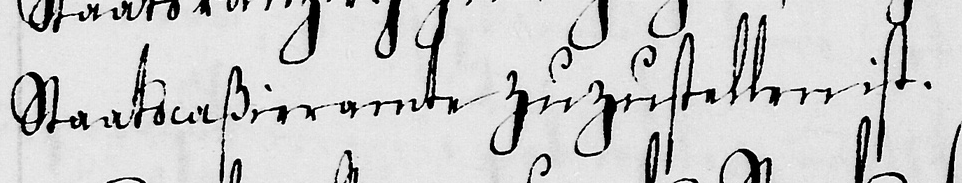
Staatscaßieramte zuzustellen ist.
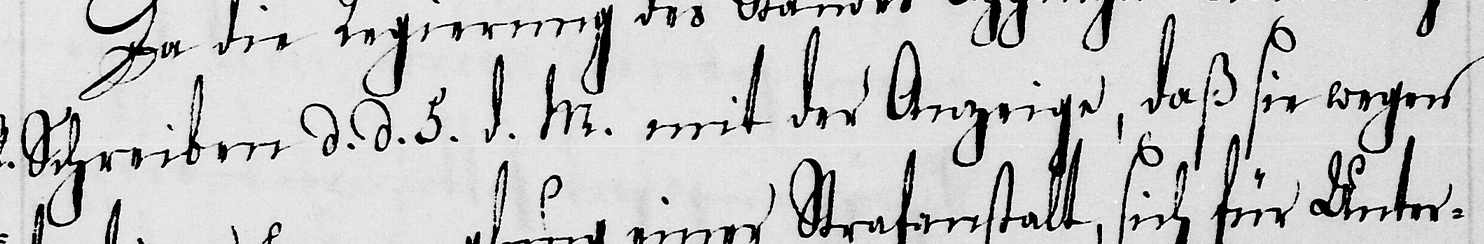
Schreiben d. d. 5. d. M. mit der Anzeige, daß sie wegen
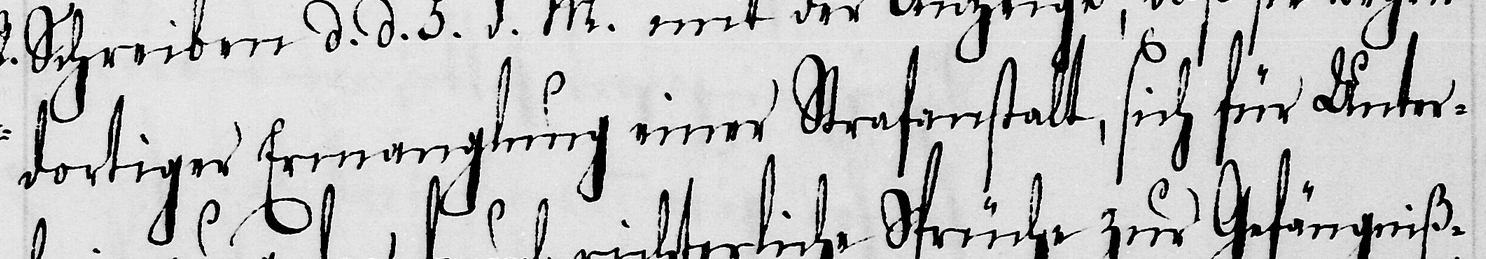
dortiger Ermangelung einer Strafanstalt, sich für Unter¬
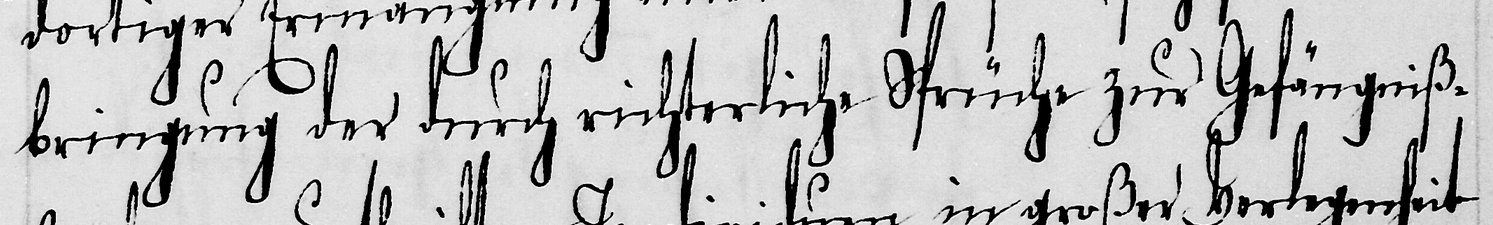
bringung der durch richterliche Sprüche zur Gefängniß¬
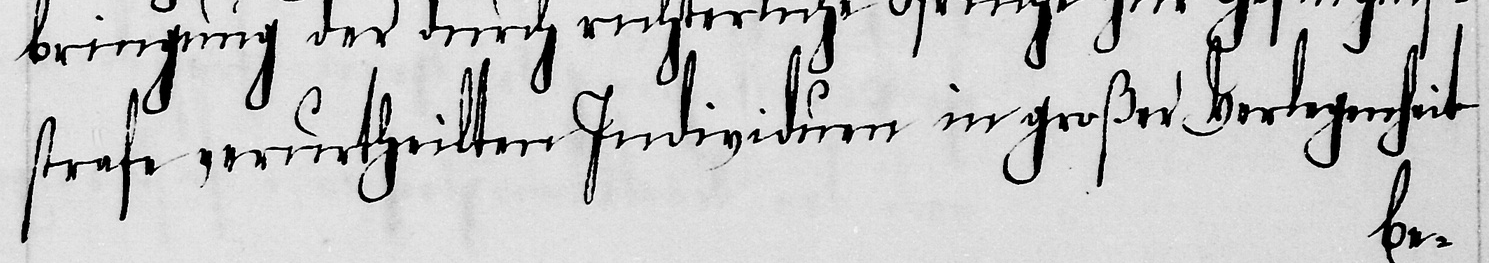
strafe verurtheilten Individuen in großer Verlegenheit
